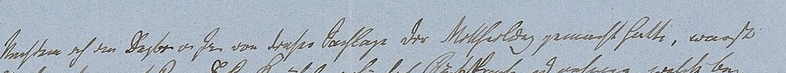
Nachdem ich im Dezbr v. Jr. von dieser Sachlage Dir Mittheilung gemacht hatte, warst
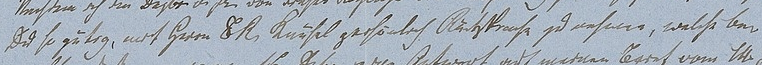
Du so gütig, mit Herrn BR. Knüsel persönlich Rücksprache zu nehmen, welche be-
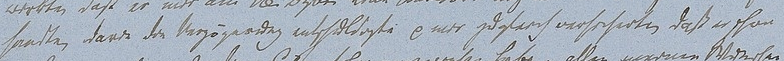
sandte, darin die Verzögerung entschuldigte & mir zugleich versicherte, daß er schon
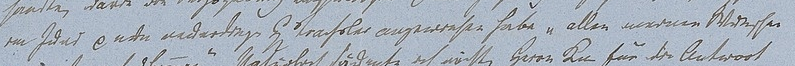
im Juni & nun neuerdings Hrn Trachsler angewiesen habe «allen meinen Wünschen
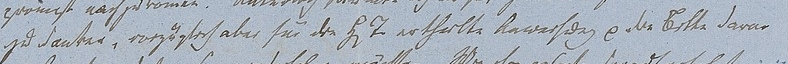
zu danken, vorzüglich aber für die Hrn T. ertheilte Anweisung & die Bitte daran
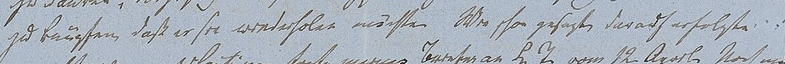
zu knüpfen, daß er sie wiederholen möchte. Wie schon gesagt, darauf erfolgte
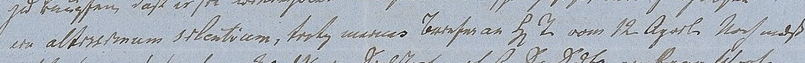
ein altissimum silentium, trotz meines Briefes an Hrn. T. vom 12. April. Noch muß
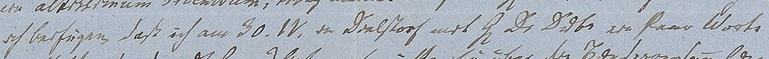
ich beifügen, daß ich am 30. IV. in Dielstorf mit Hrn Dr Dubs ein Paar Worte
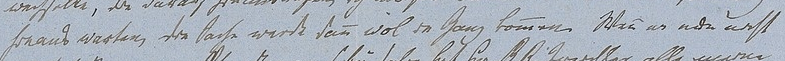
hinaus warten, die Sache werde dann wol in Gang kommen. Wenn es nun erst
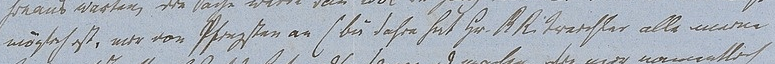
möglich ist, mir von Pfingsten an (bis dahin hat Hr. R.R. Treichler alle meine
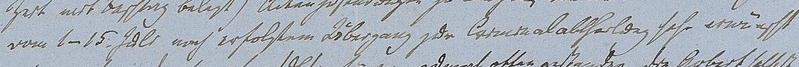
vom 1-15. Juli nach erfolgtem Übergang zur Criminalabtheilung sehr erwünscht
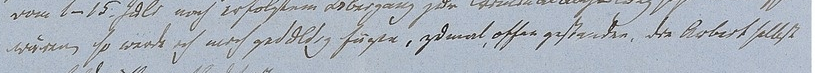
wären, so werde ich mich geduldig fügen, zumal, offen gestanden, die Arbeit selbst
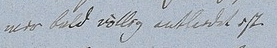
mir bald völlig entleidet ist.
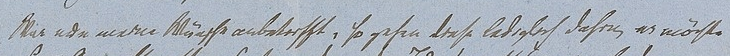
Was nun meine Wünsche anbetrifft, so gehen diese lediglich dahin, es möchte
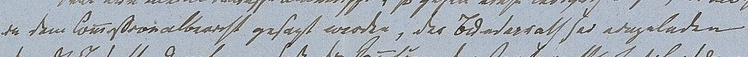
in dem Commissionsbericht gesagt werden, der Bundesrath sei eingeladen
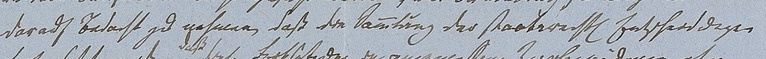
darauf Bedacht zu nehmen, daß die Sammlung der staatsrechtlichen Entscheidungen
